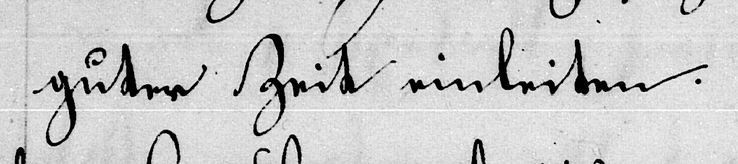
guter Zeit einleiten.
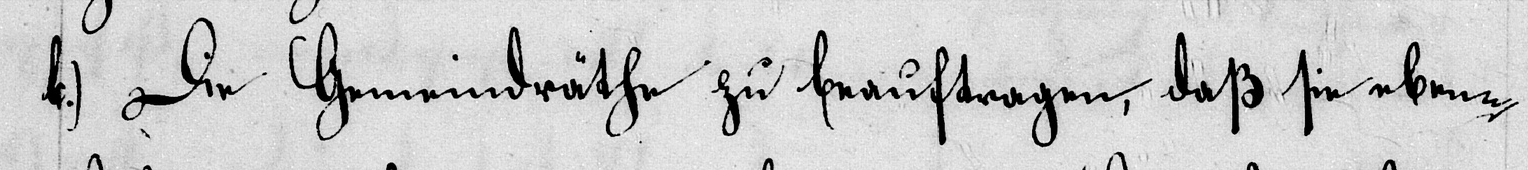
b.) Die Gemeindräthe zu beauftragen, daß sie eben¬
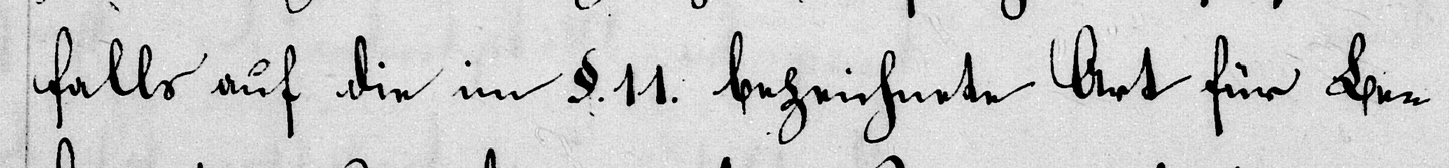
falls auf die im §. 11. bezeichnete Art für Be¬
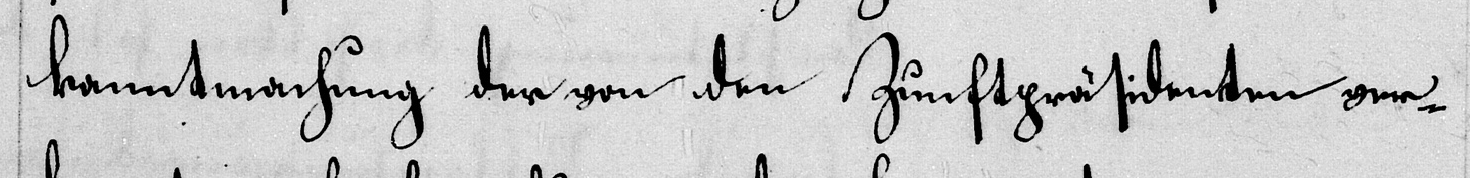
kanntmachung der von den Zunftpräsidenten ver¬
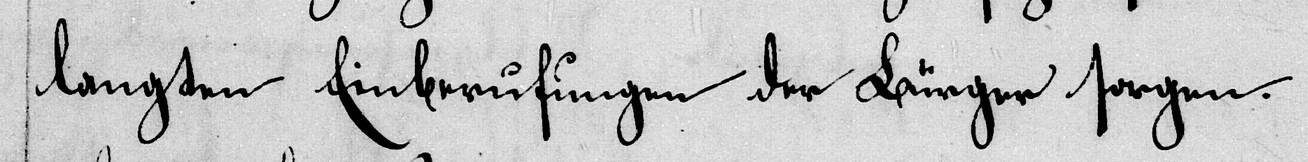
langten Einberufungen der Bürger sorgen.
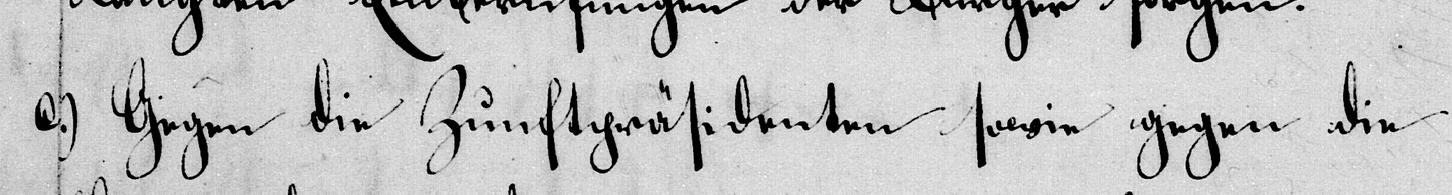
c.) Gegen die Zunftpräsidenten sowie gegen die
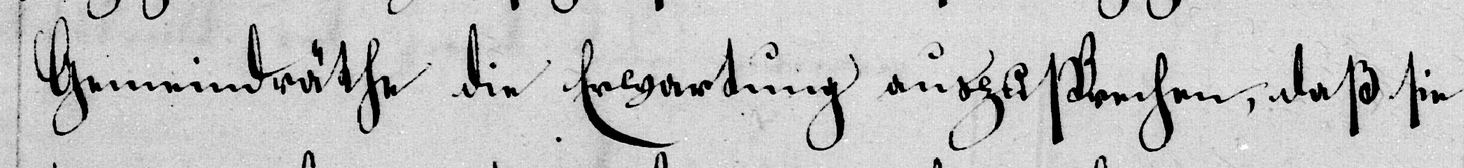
Gemeindräthe die Erwartung auszusprechen, daß sie
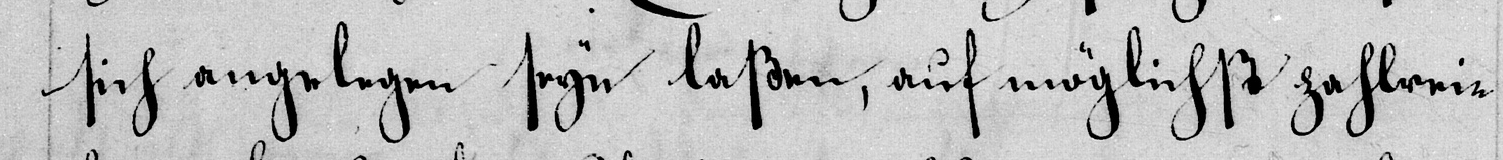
sich angelegen seyn laßen, auf möglichst zahlrei¬
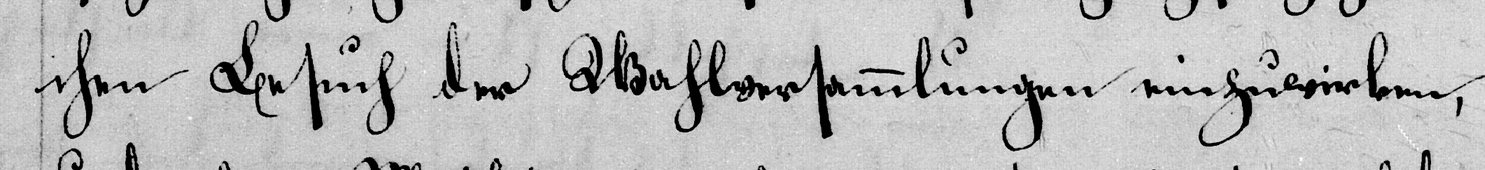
chen Besuch der Wahlversammlungen einzuwirken,
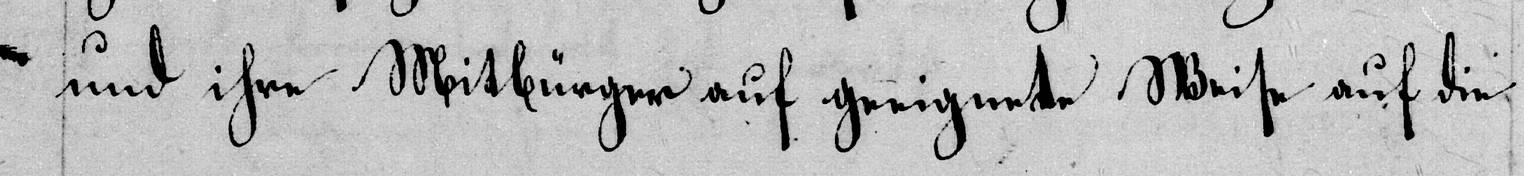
und ihre Mitbürger auf geeignete Weise auf die
